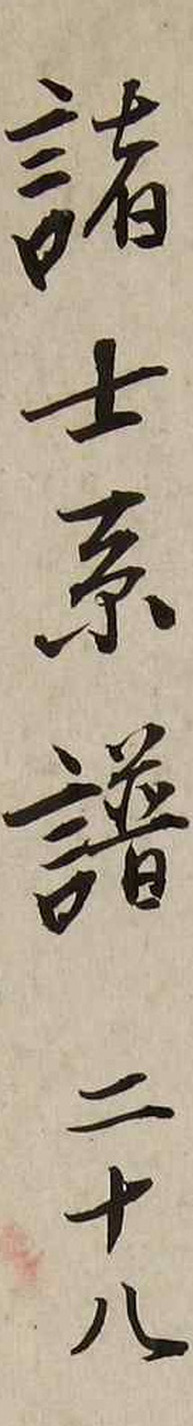諸士系譜二十八

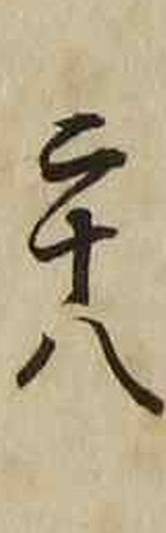二十八
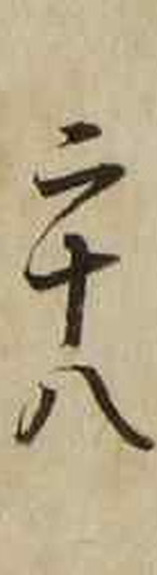二十八

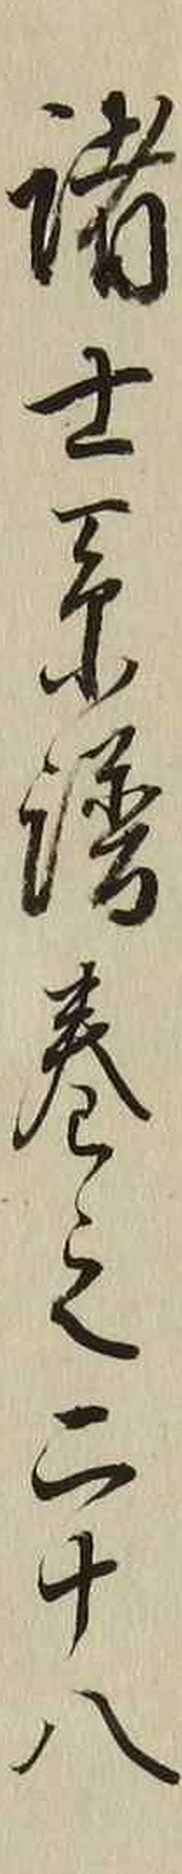諸士系譜巻之二十八
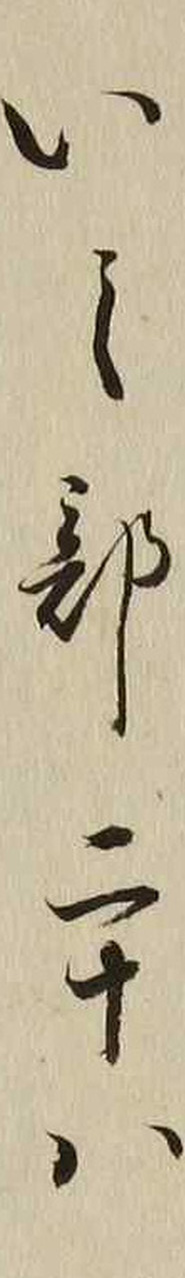い之部二十八
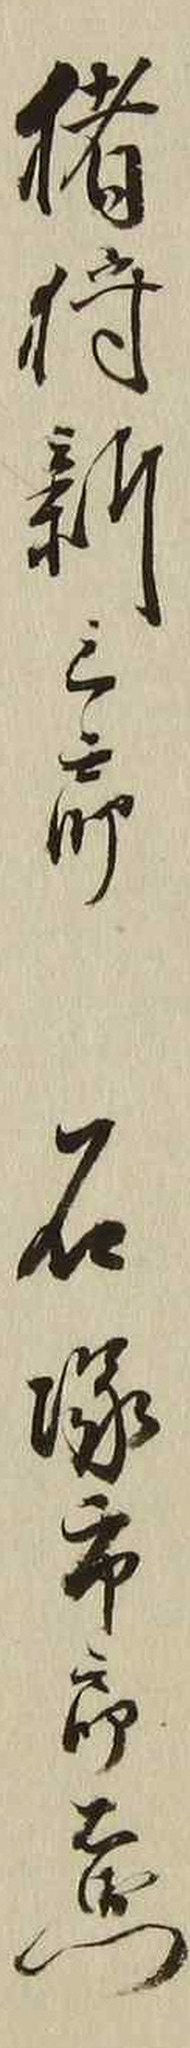猪狩新三郎石塚市郎右衛門

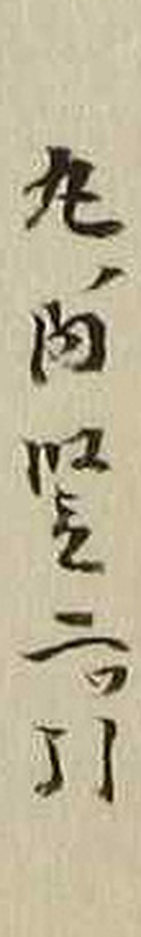又丸ノ内竪二ツ引
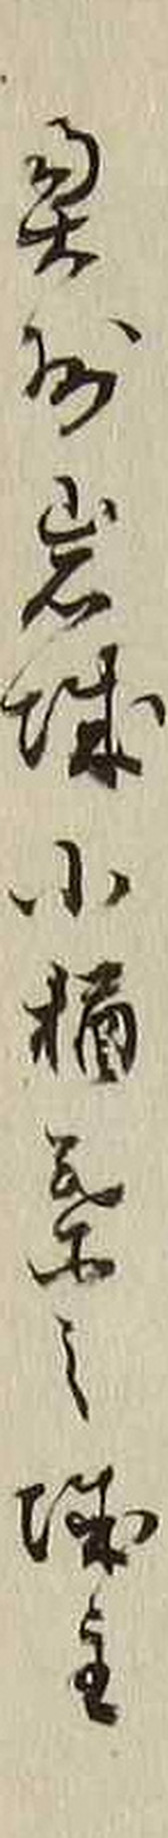奥州岩城小楢葉之城主
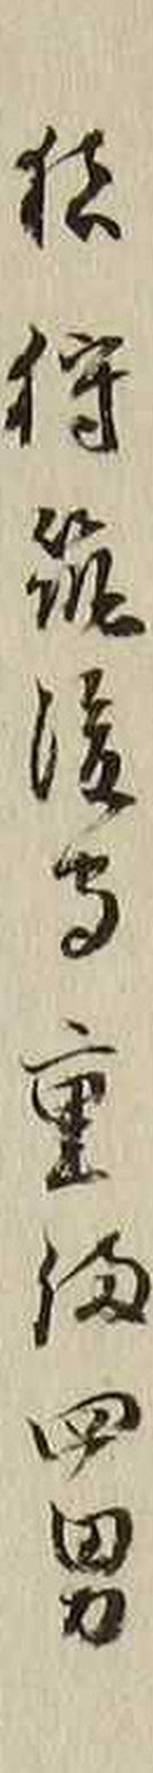猪狩筑後守重満四男
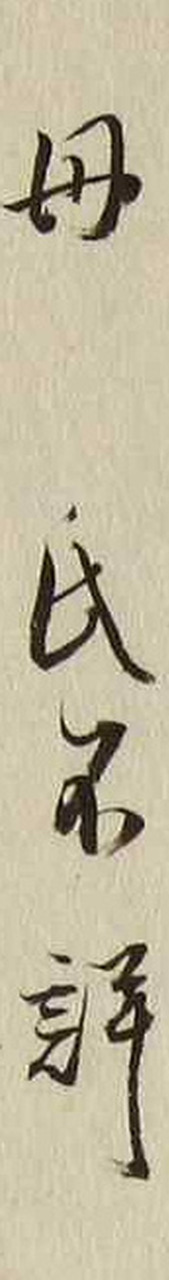母氏不詳
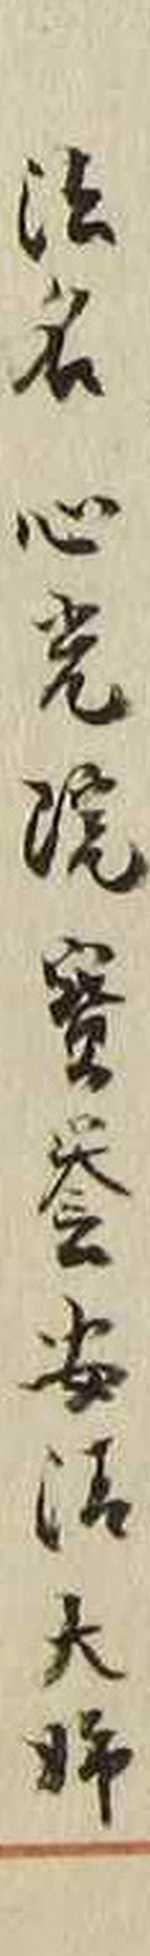法名心光院宝誉安清大姉
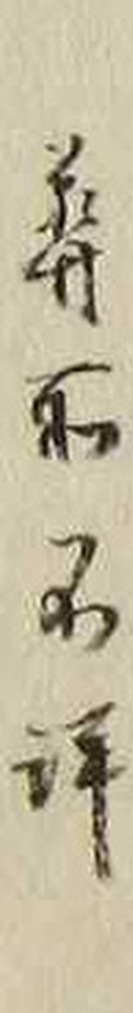葬所不詳
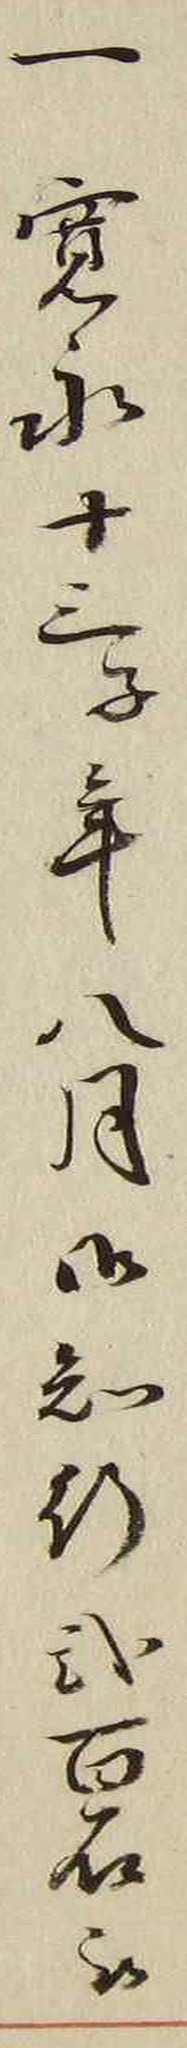一寛永十三子年八月御知行弐百石被

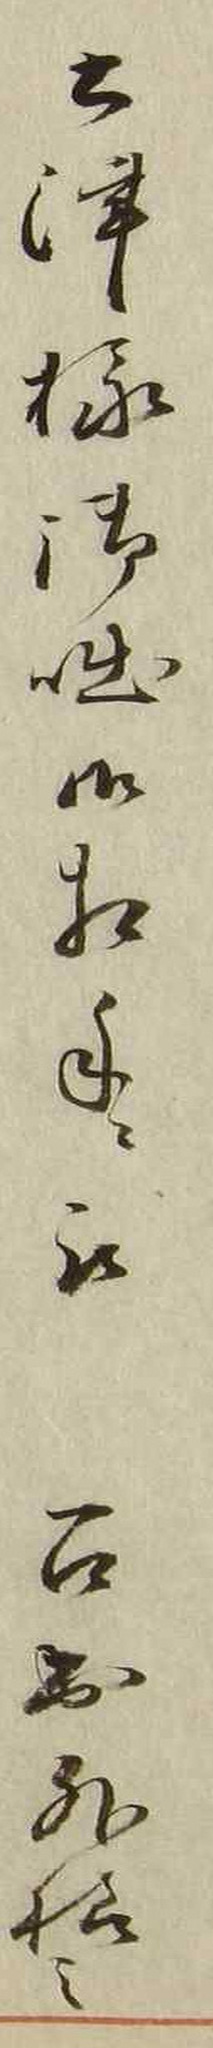土津様御咄御相手ニ被召出外様之
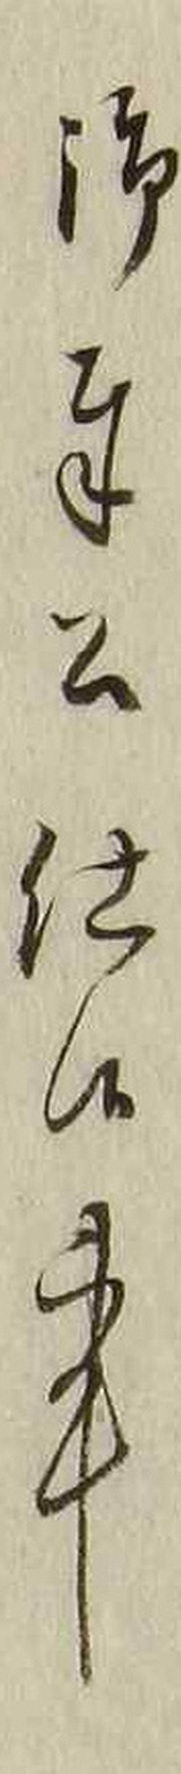御奉公仕候事
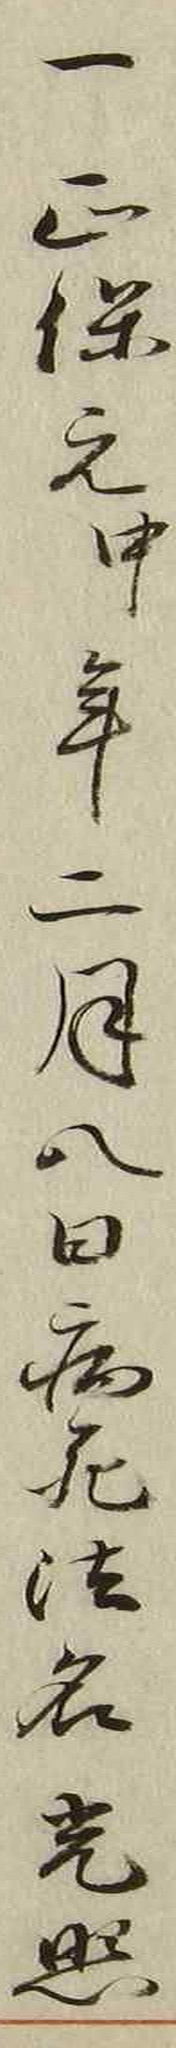一正保元申年二月八日病死法名光照
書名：諸士系譜　巻之28　い之部28
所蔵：会津若松市立会津図書館
